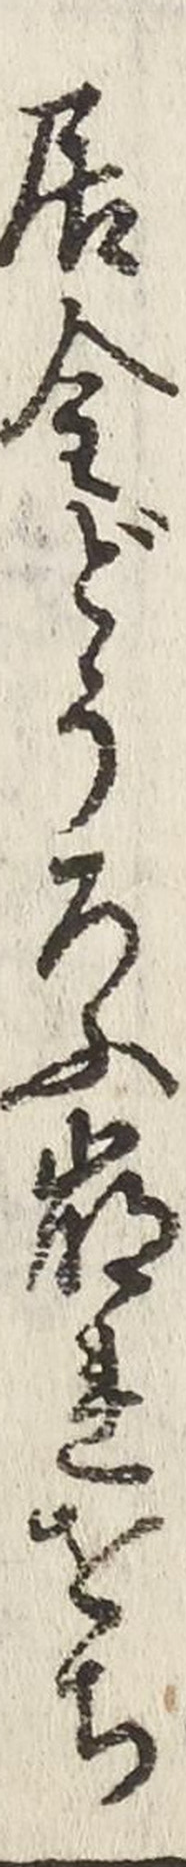居金どうろふ崩れをち
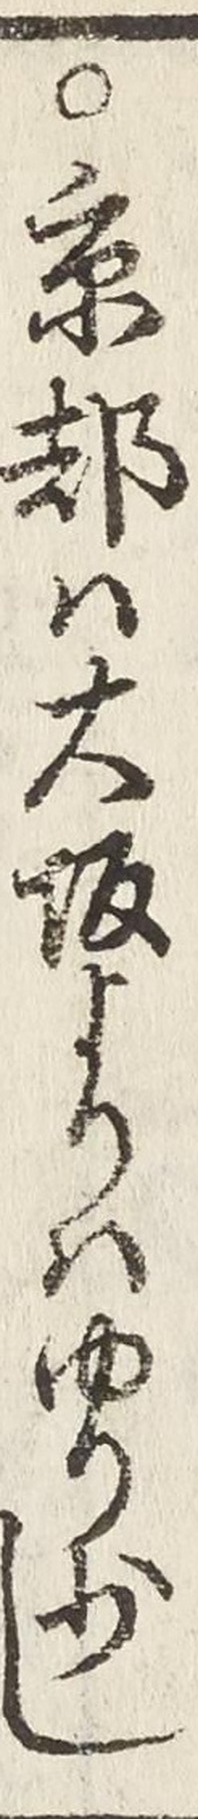○京都は大坂よりはゆり少し
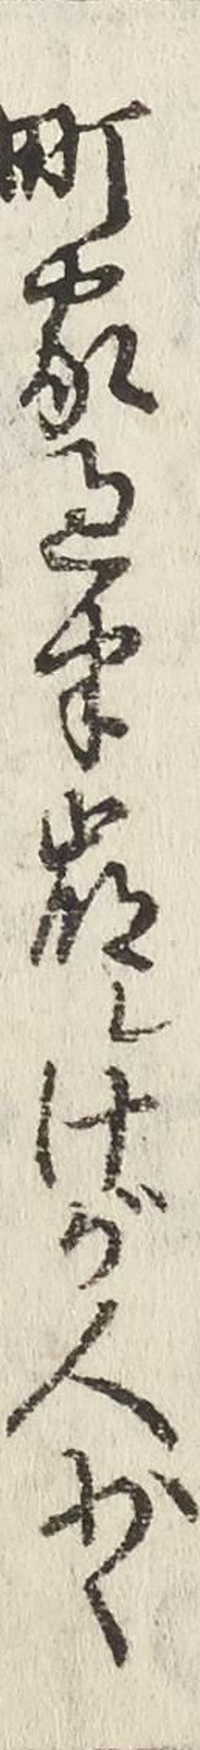町家過半崩レけが人少々
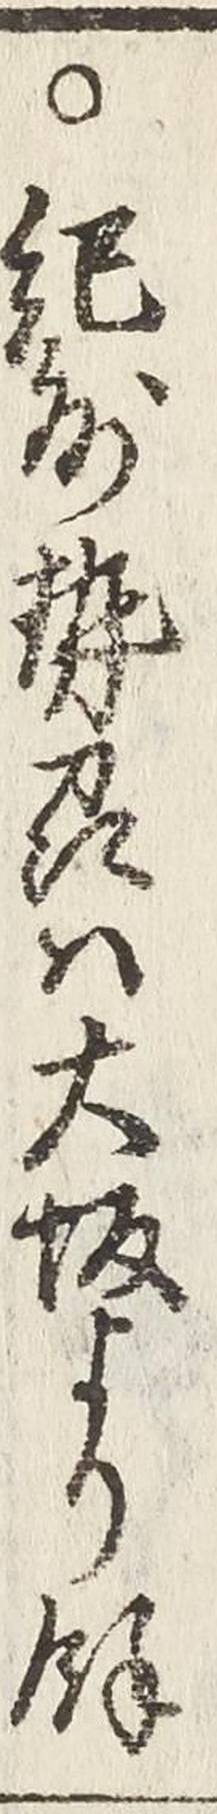○紀州勢州は大坂より余
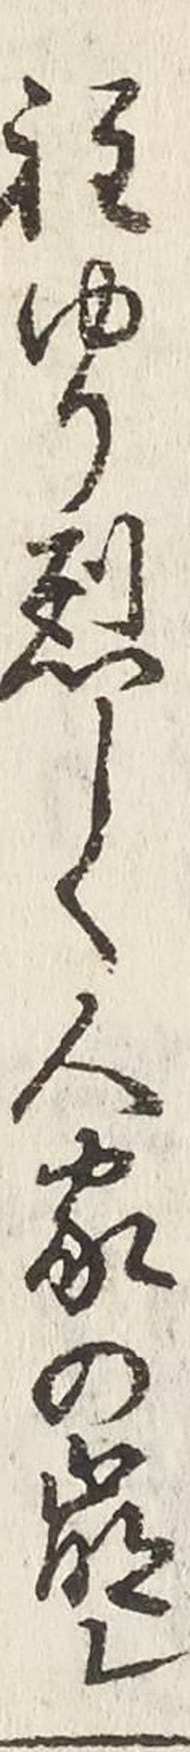程ゆり烈しく人家の崩レ
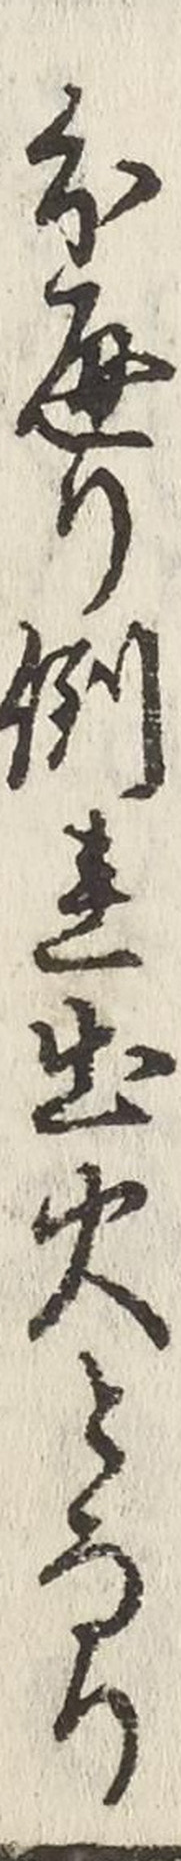分通り倒れ出火となり
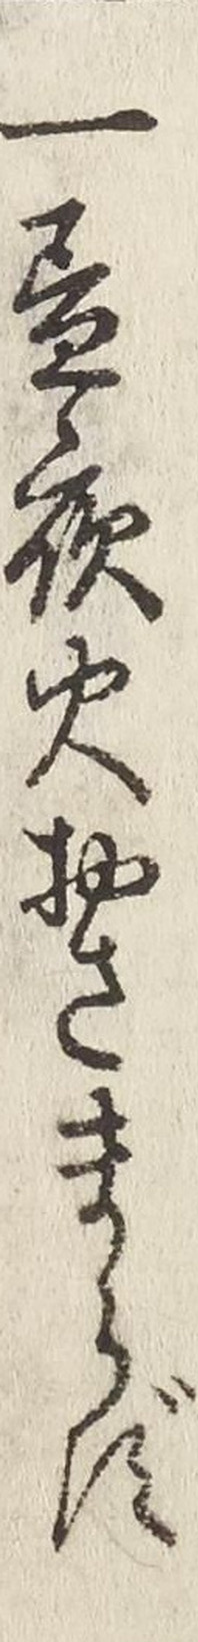一昼夜火おさまらず
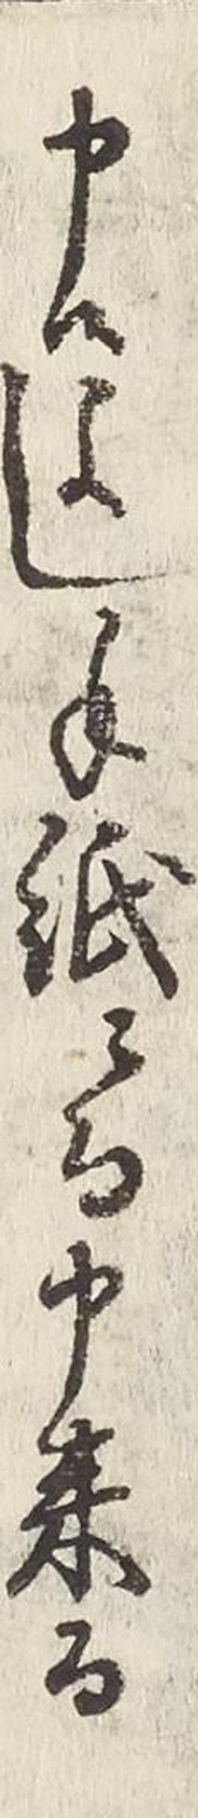申候よし手紙ニ而申来る

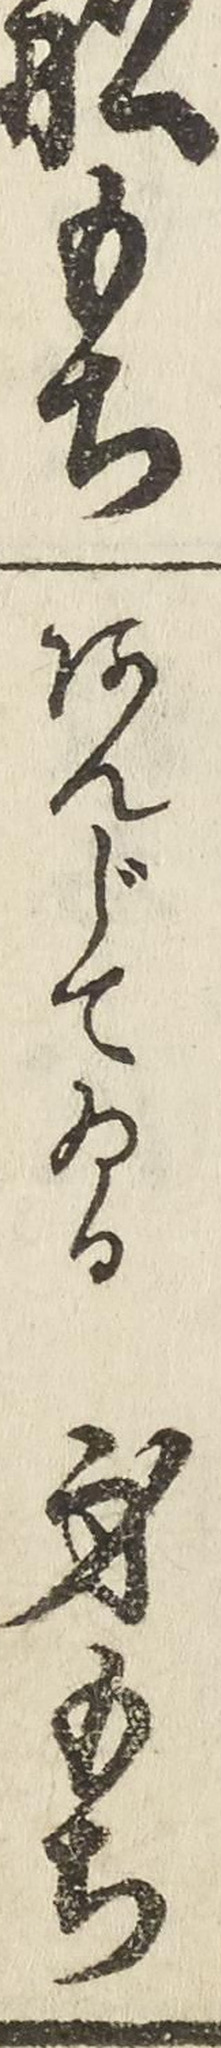あんじてゐる身もち
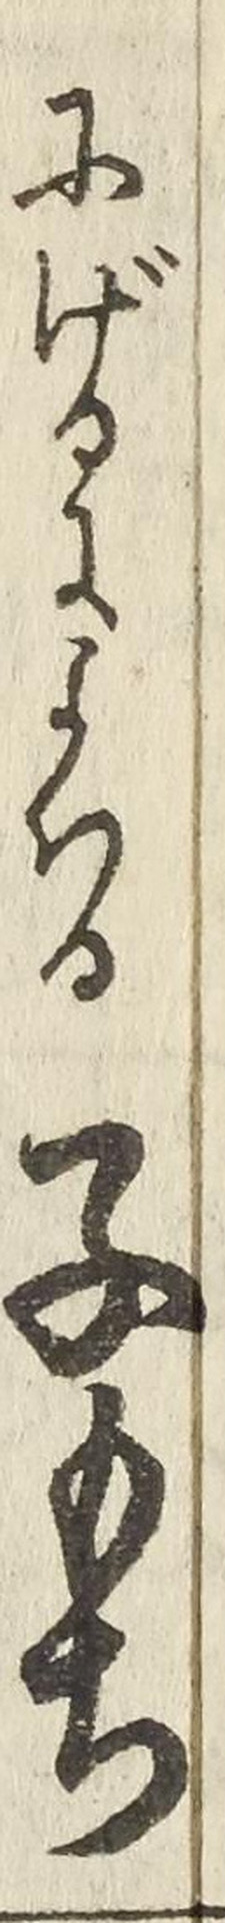にげるによはる子もち

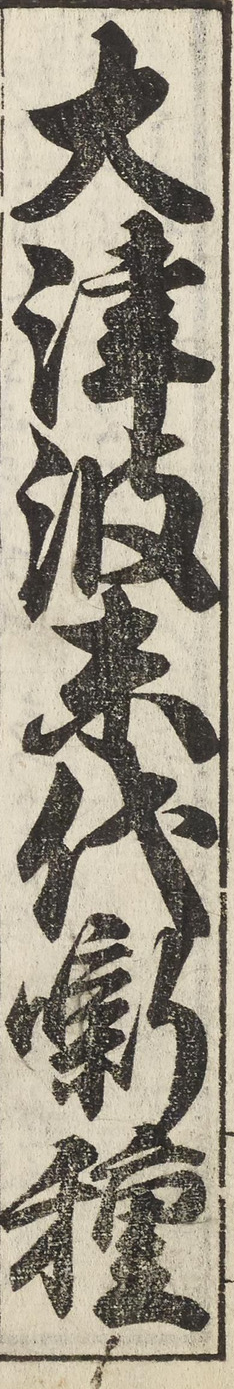大津波末代噺種
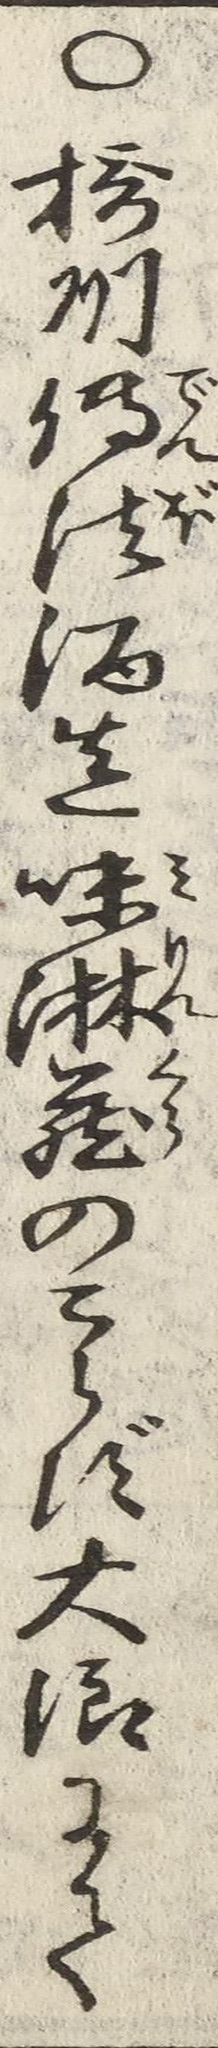○摂州伝法酒造味醂蔵のこらず大浪にて
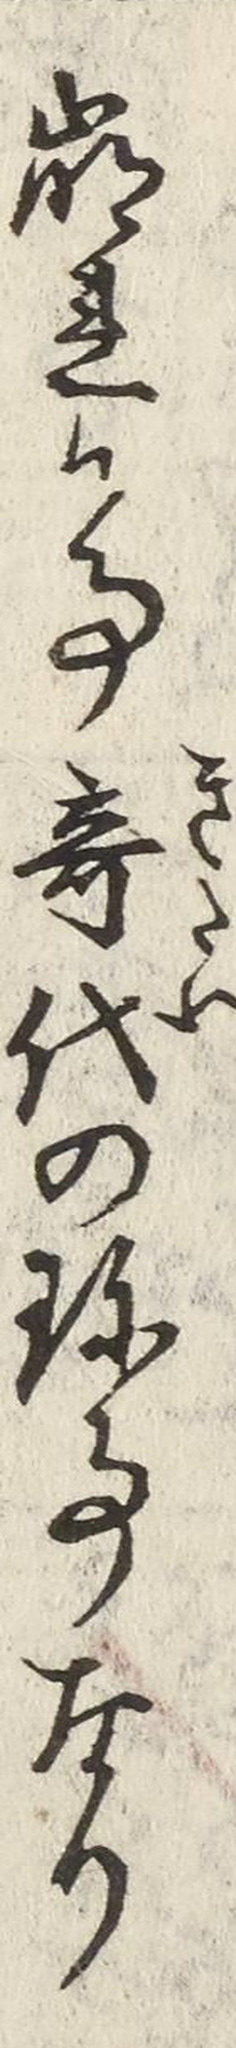崩れ候事奇代の珍事なり
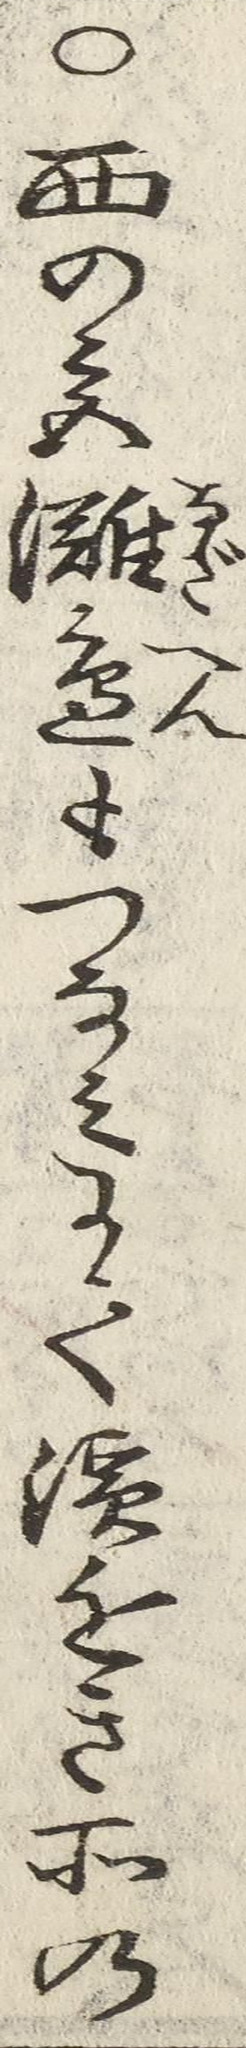○西の宮灘辺もつなみにて浜近き所の
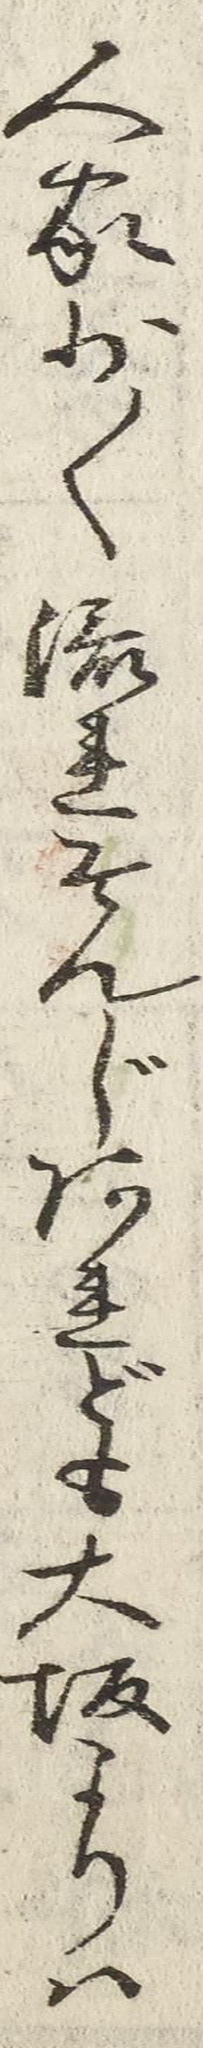人家少々流れそんじあれども大坂よりは
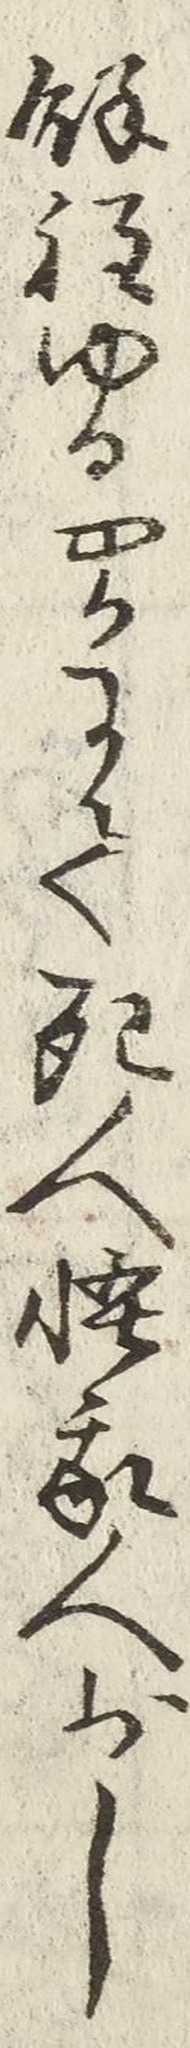余程ゆるやかにて死人怪我人少し
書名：大地震大津浪末代噺種　（二編　全）
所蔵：東京大学地震研究所図書室 Earthquake Research Institute Library, The University of Tokyo, JAPAN
